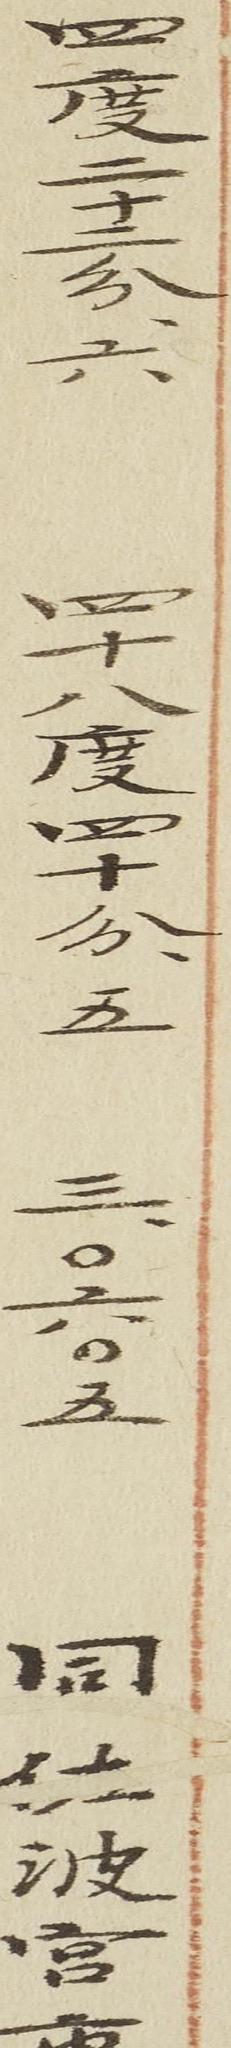四度二十二分、六四十八度四十分、五三、〇六〇五同佐渡宮市
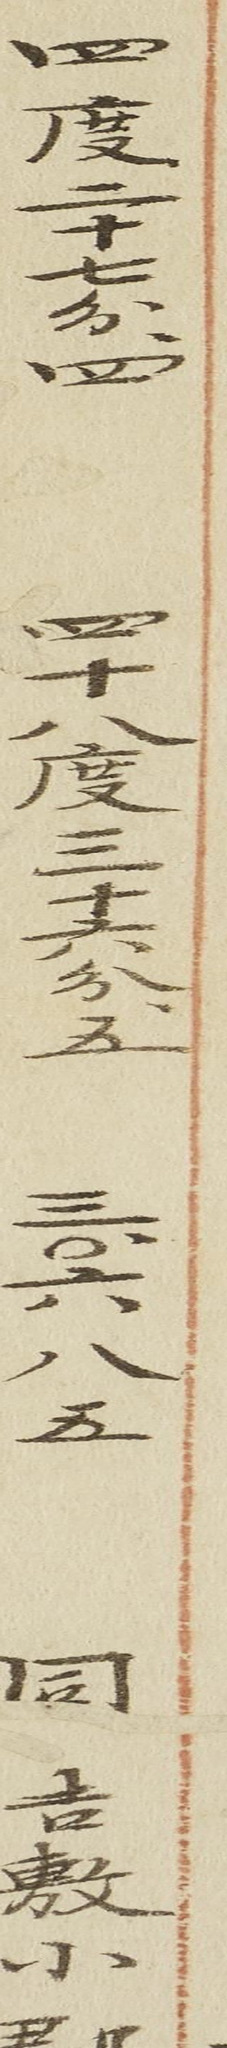四度二十七分、四四十八度三十六分、五三、〇六八五同吉敷小郡
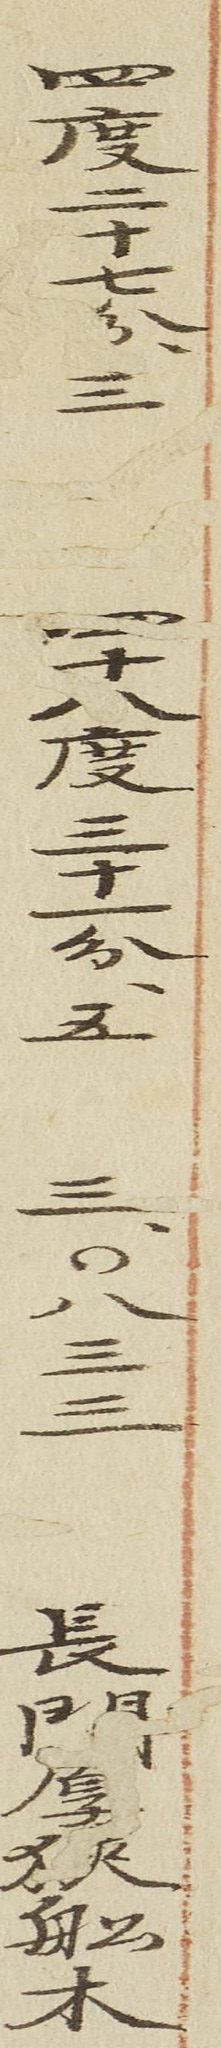四度二十七分、三四十八度三十一分、五三、〇八三三長門厚狭船木

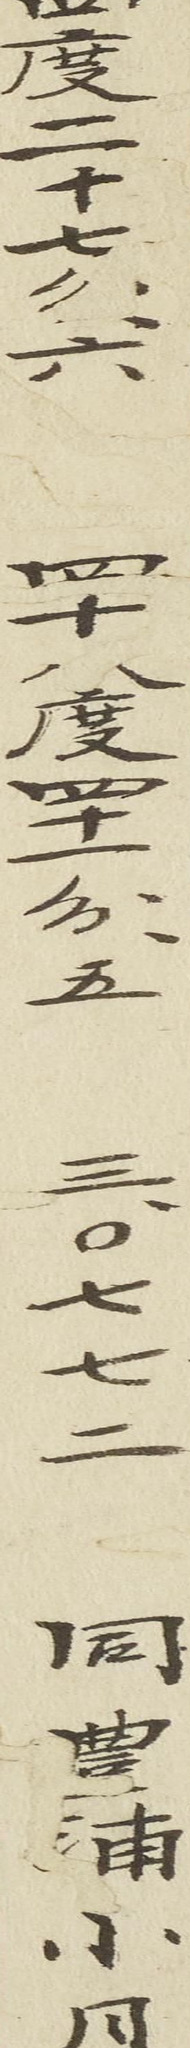四度二十七分、六四十八度四十一分、五三、〇七七二同豊浦小月
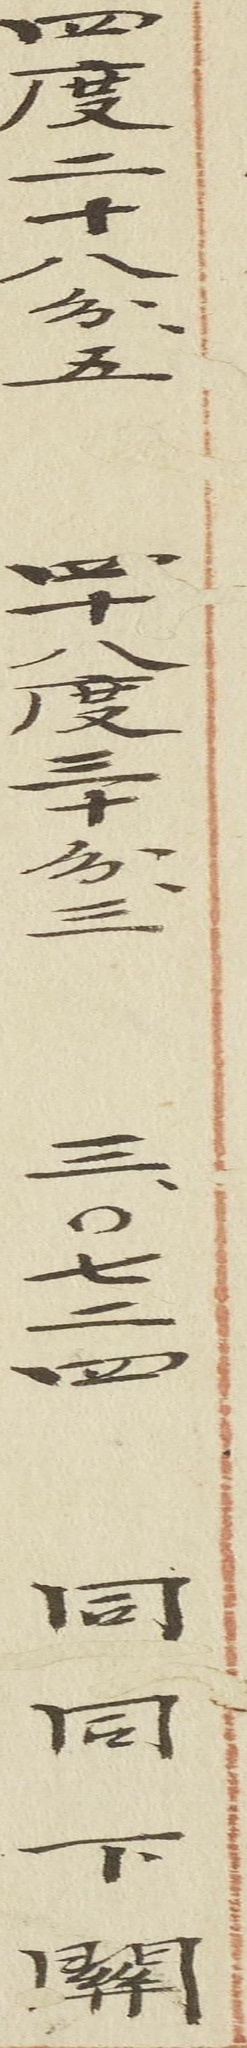四度二十八分、五四十八度三十分、三三、〇七二四同同下関
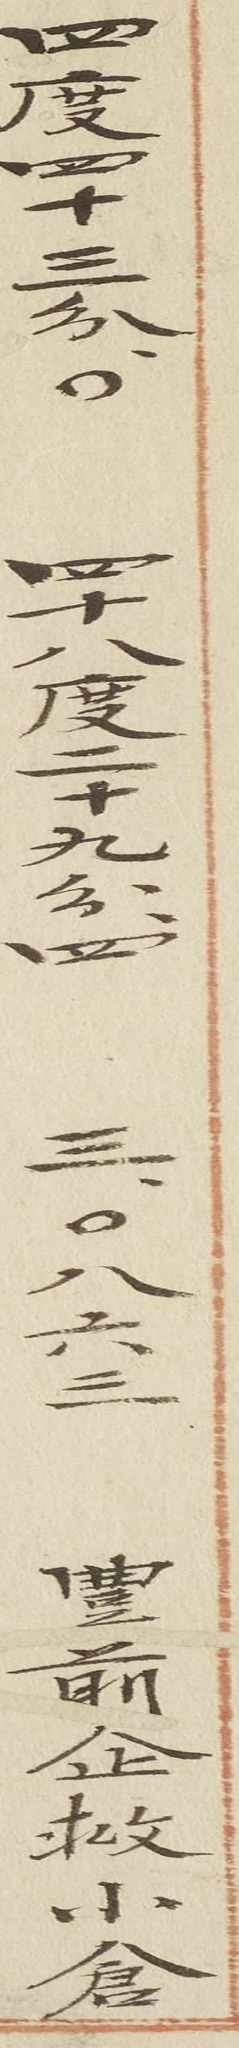四度四十三分、〇四十八度二十九分、四三、〇八六三豊前企救小倉
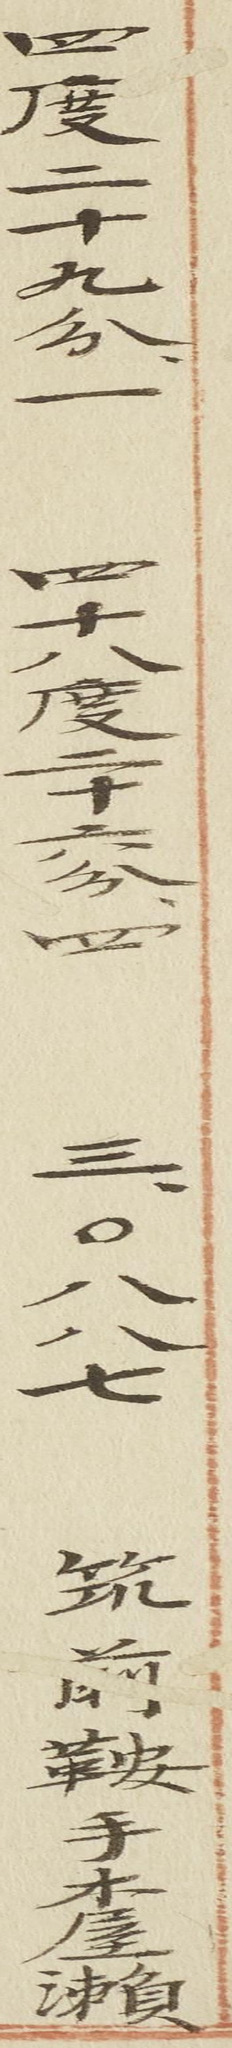四度二十九分、一四十八度二十六分、四三、〇八八七筑前鞍手木屋瀬
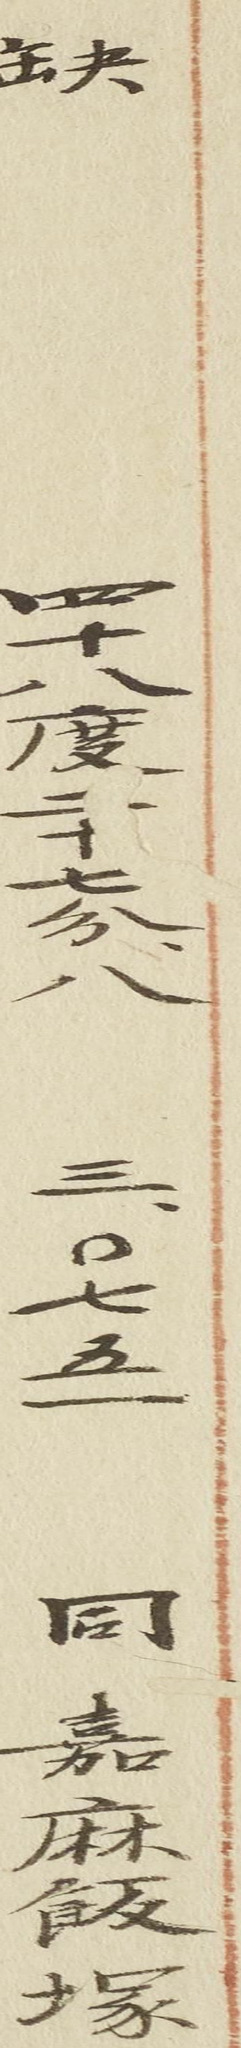欠四十八度二十七分、八三、〇七五一同嘉麻飯塚
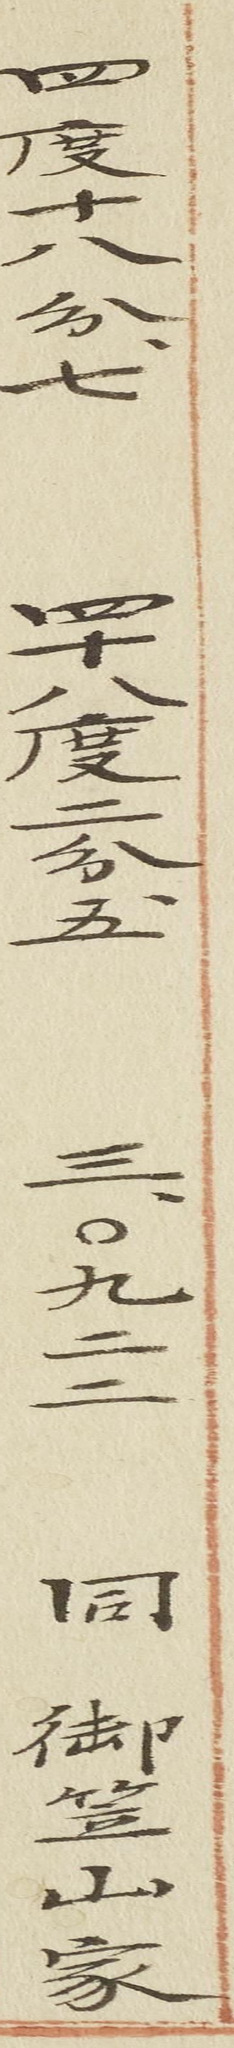四度十八分、七四十八度二分、五三、〇九二二同御笠山家
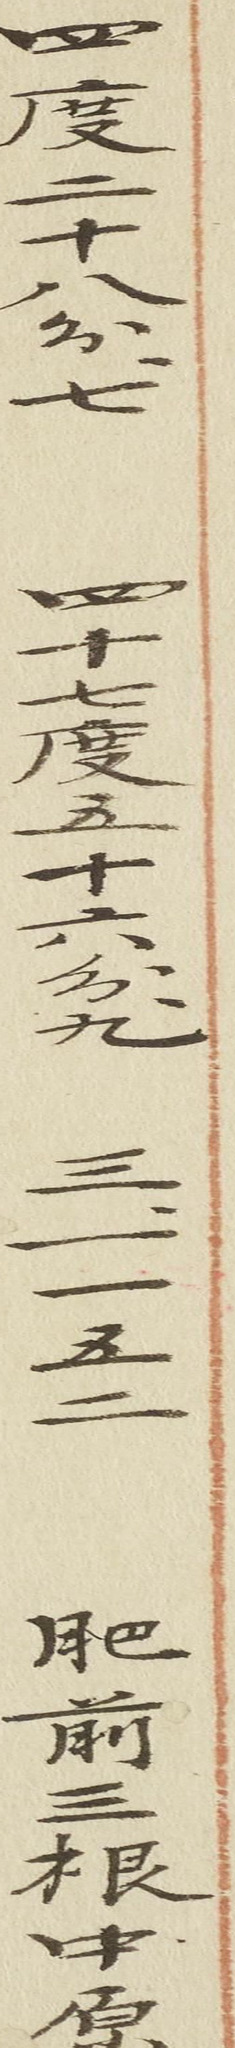四度二十八分、七四十七度五十六分、九三、一一五二肥前三根中原
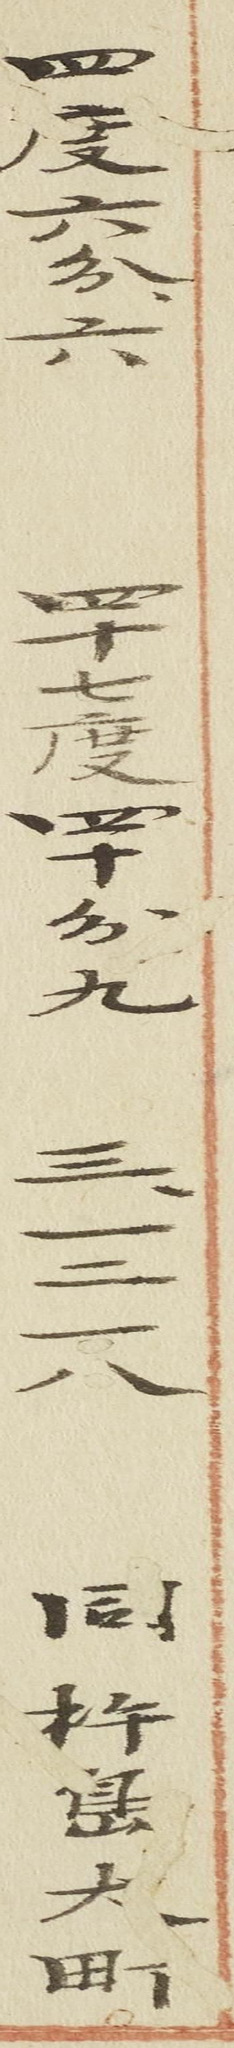四度六分、六四十七度四十分、九三、一二一八同杵島大町
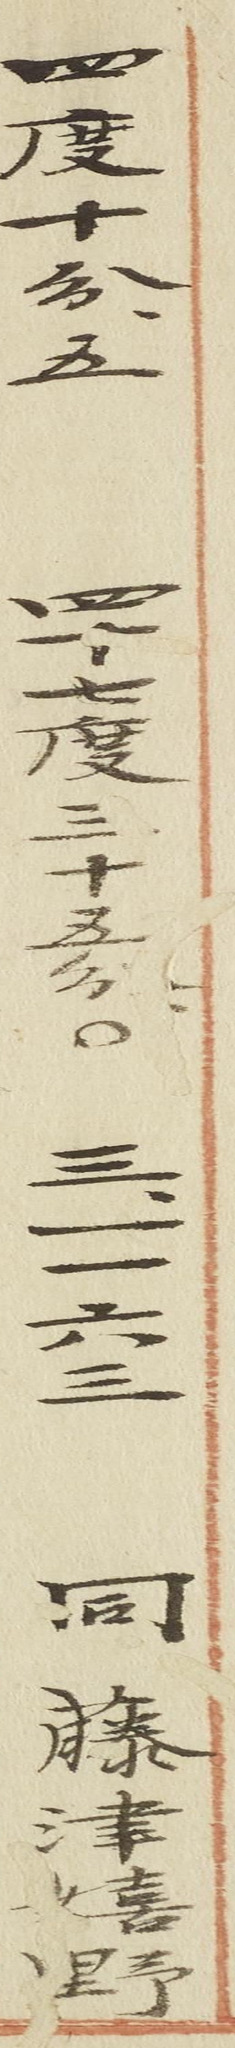四度十分、五四十七度三十五分、〇三、一一六三同藤津嬉野
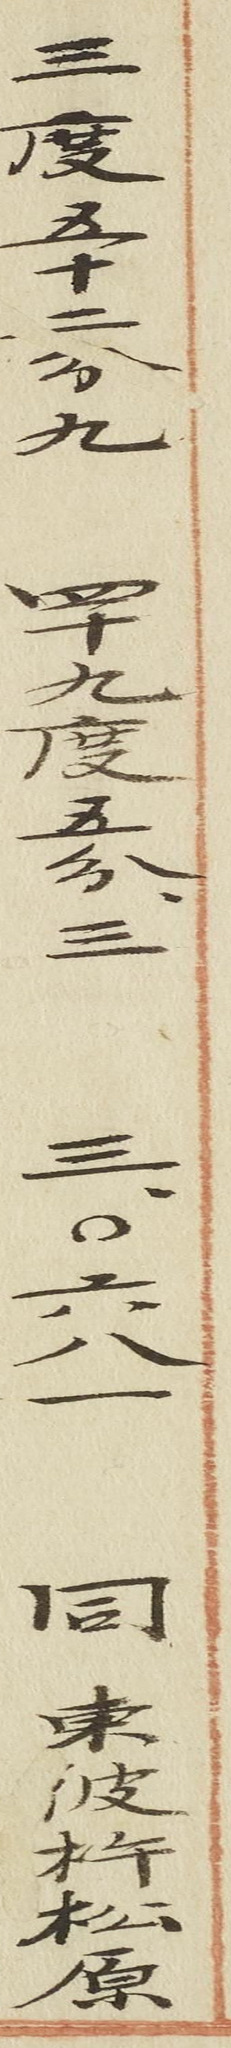三度五十二分、九四十九度五分、三三、〇六八一同東彼杵松原
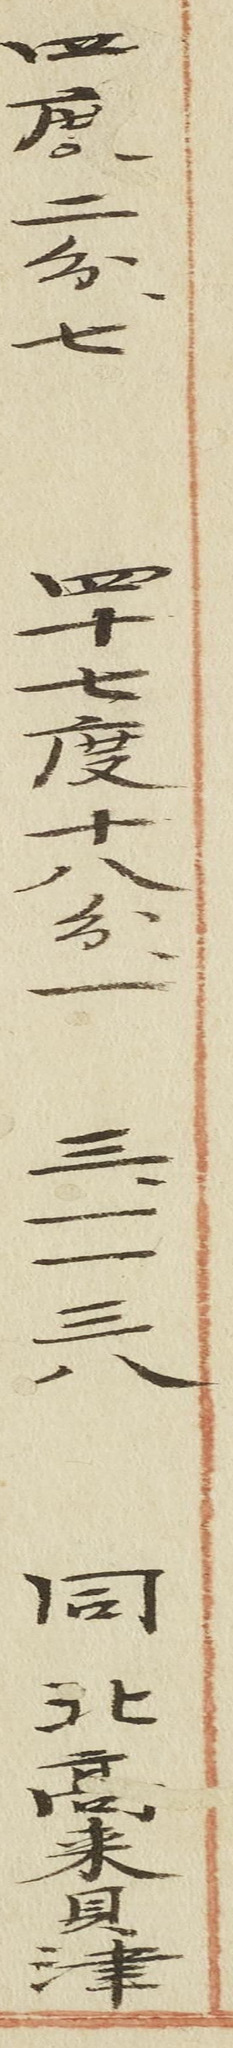四度二分、七四十七度十八分、一三、一一三八同北高来貝津
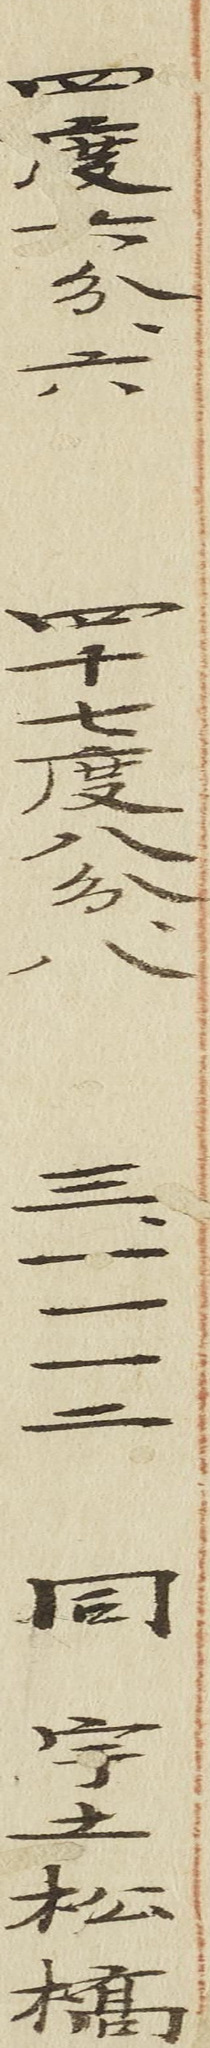四度六分、六四十七度八分、八三、一一一二同宇土松槁
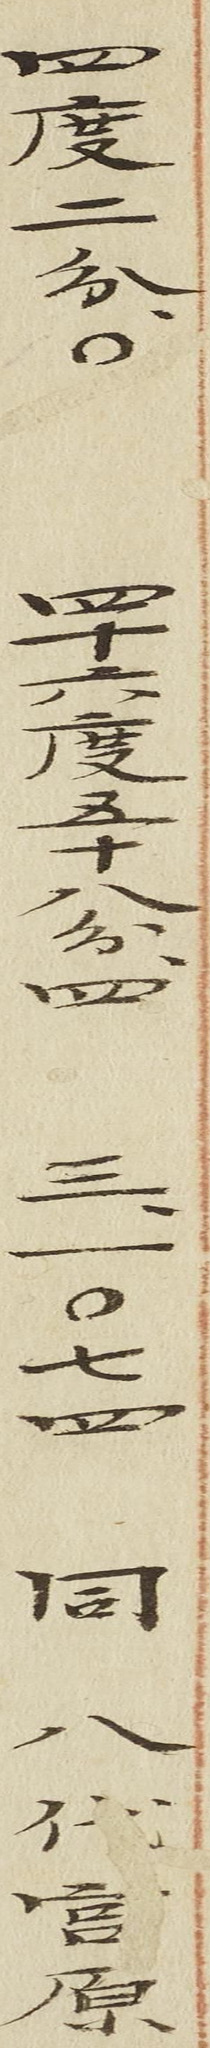四度二分、〇四十六度五十八分、四三、一〇七四同八代宮原
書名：鑷力観測報告
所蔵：東京大学地震研究所図書室 Earthquake Research Institute Library, The University of Tokyo, JAPAN
